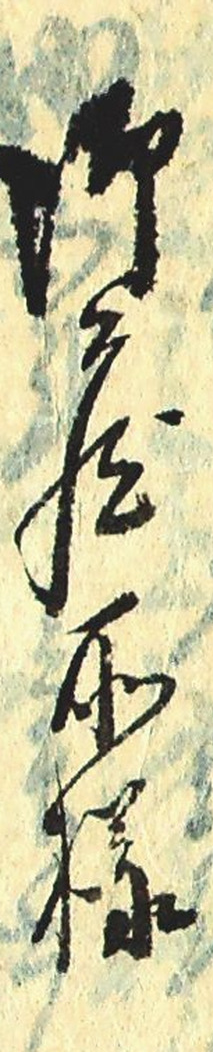御蔵所様
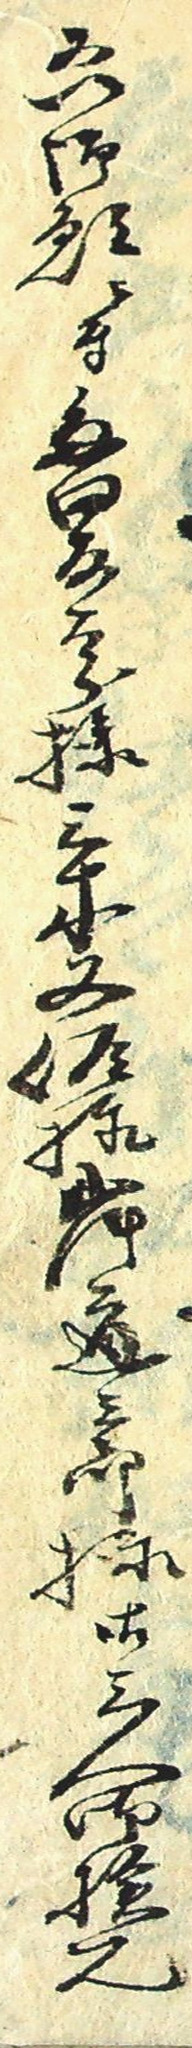右御願に付多田友太郎様三木又佐様岸道三郎様御三人御検見

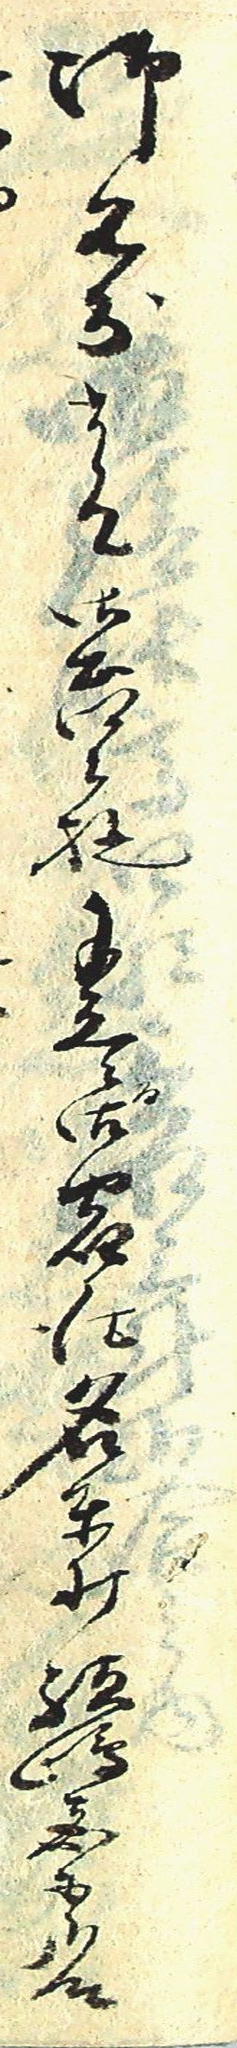御見分として御出郷被遊手元にて御宿仕名東村禎島嘉五郎殿
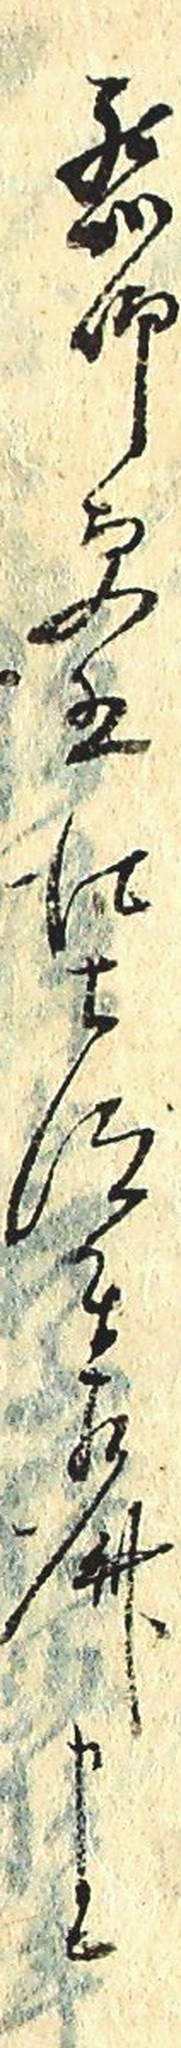罷出御受書仕被仰付相済申候
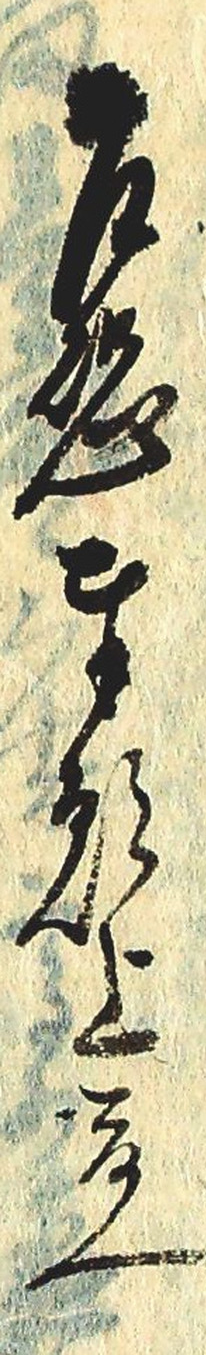乍恐奉願上覚
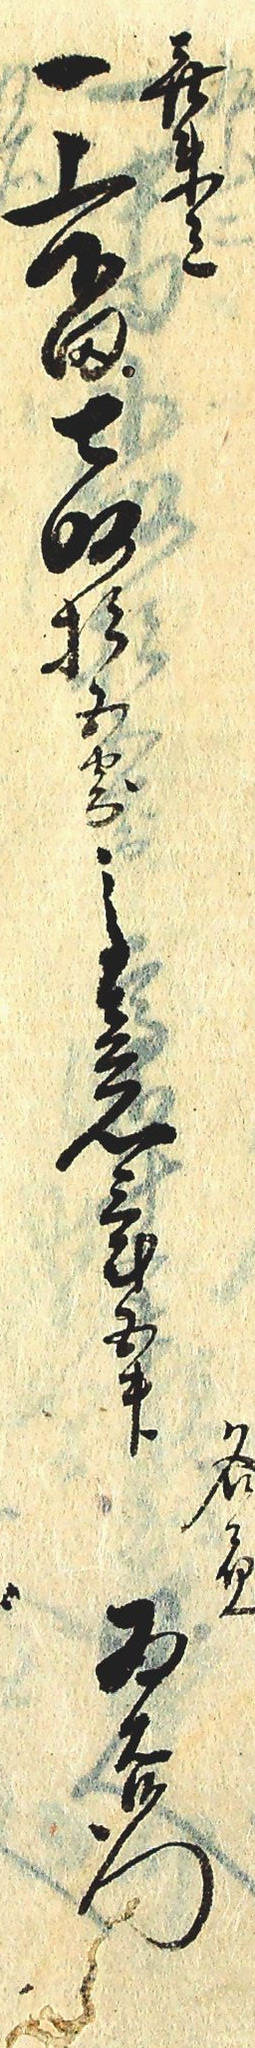一上下田七畝拾五歩高壱石三斗五升為右衛門
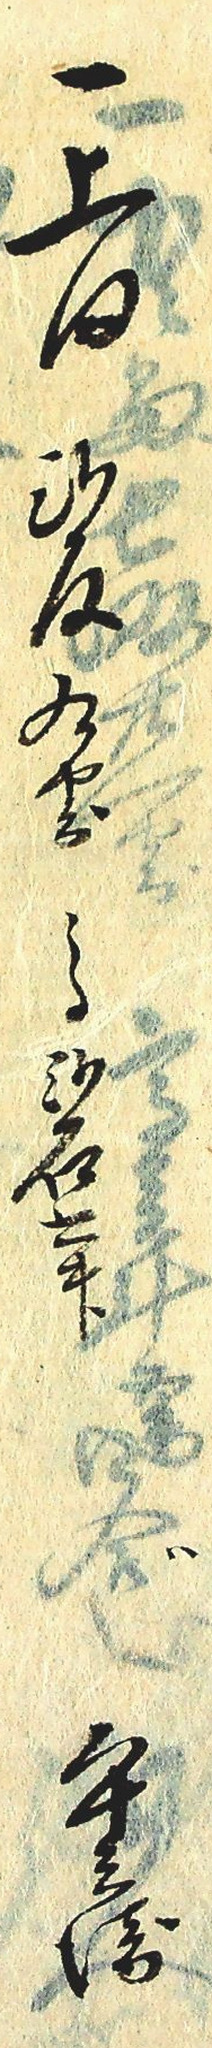一上田弐反九歩高弐石六升平兵衛
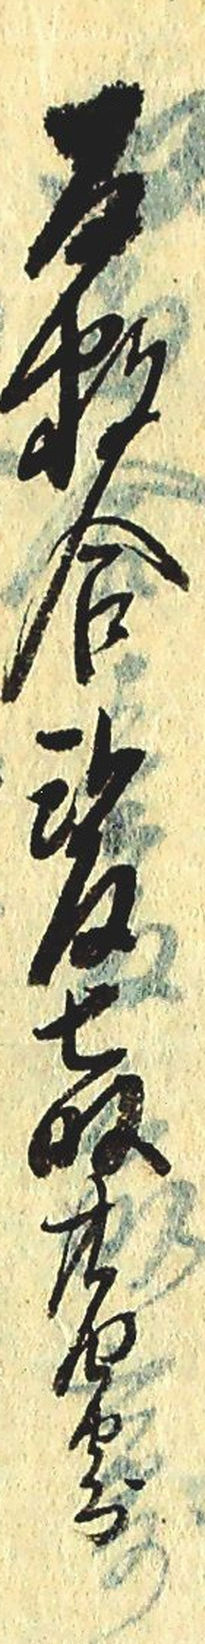反数合弍反七畝廿四歩
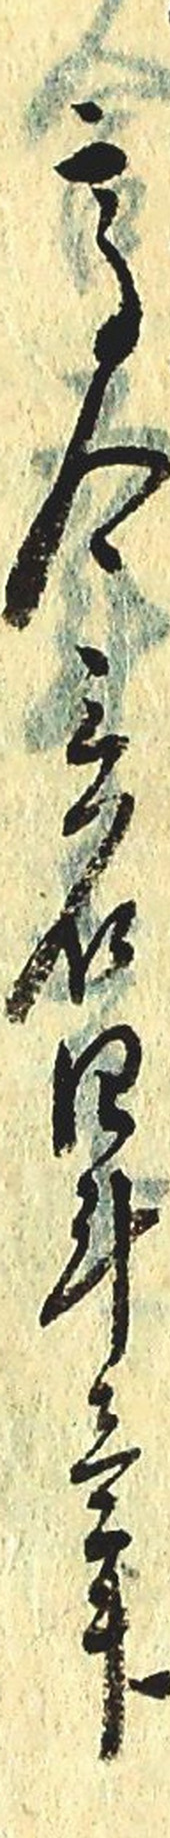高合三石四斗壱升
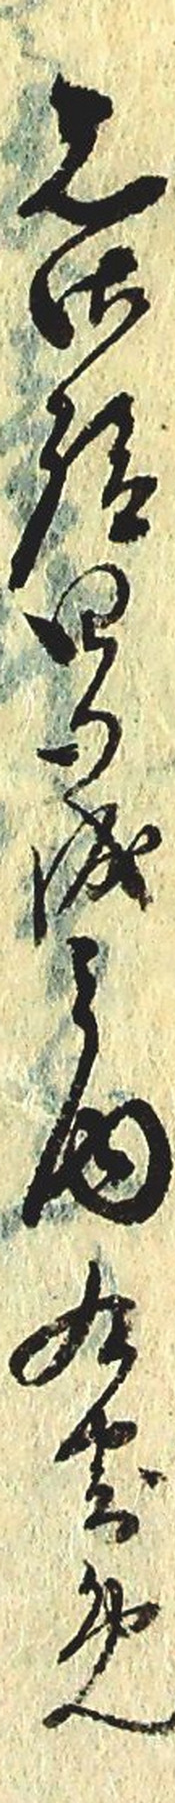右御請四つ成之内九歩免
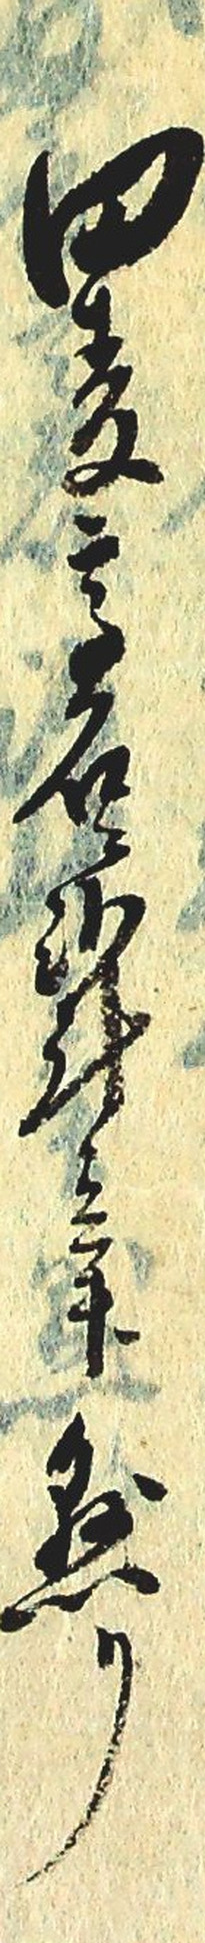田麦高石に弍斗壱升懸り
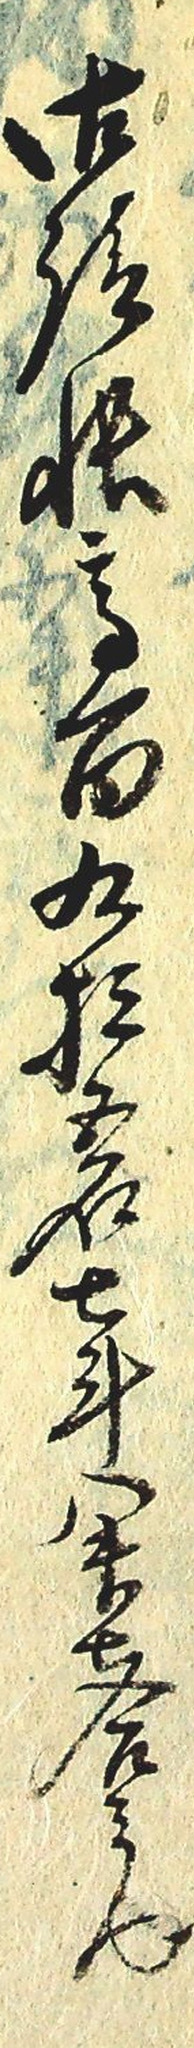御請帳高百九拾五石七斗八升七合之内
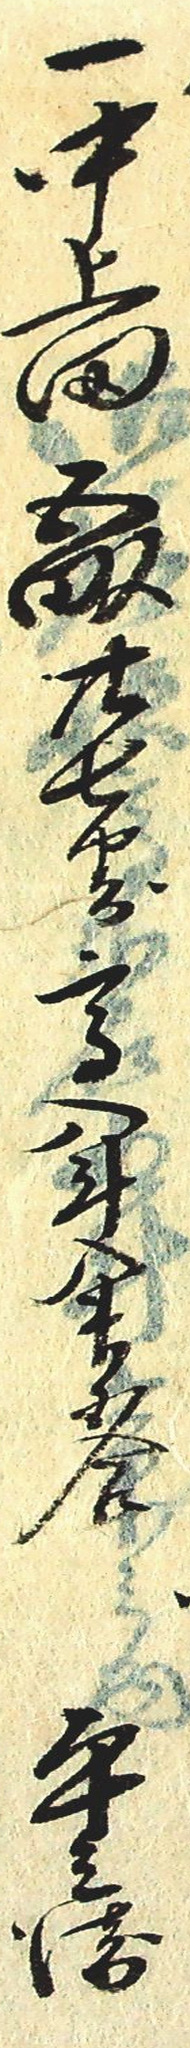一中上田五畝廿七歩高八斗八升五合平兵衛
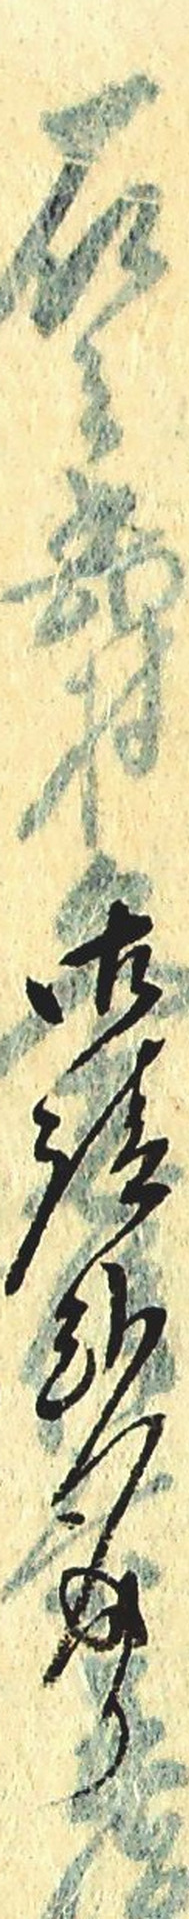御請弐つ成り
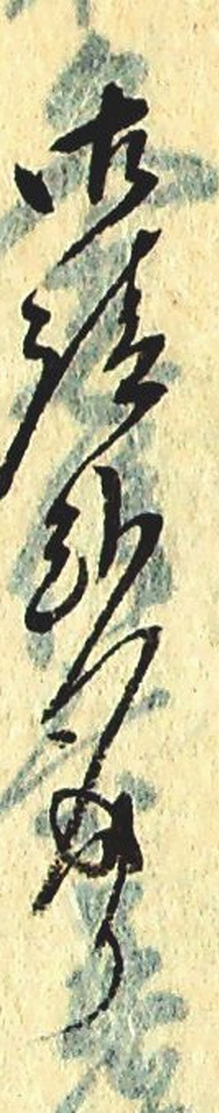御請弐つ成り
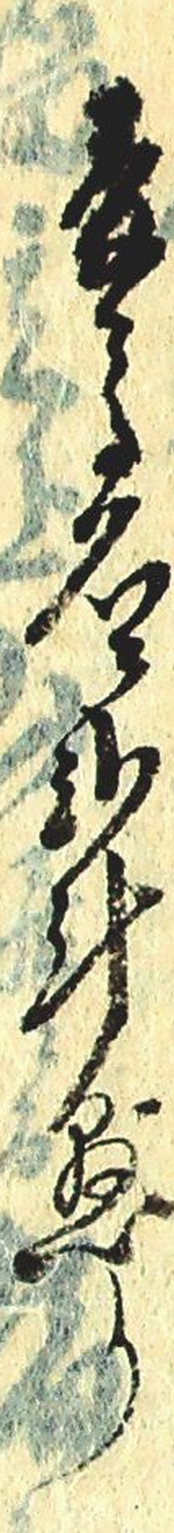麦高石に弐斗懸り
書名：諸御願書控(弐番）
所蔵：鳴門教育大学 Naruto University of Education
